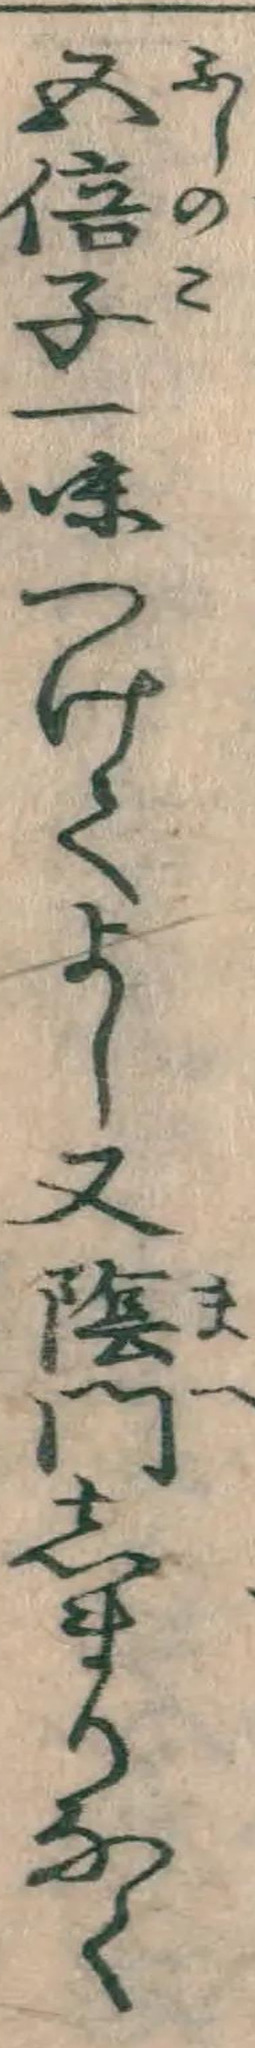五倍子一味つけてよし又陰門しまりなく
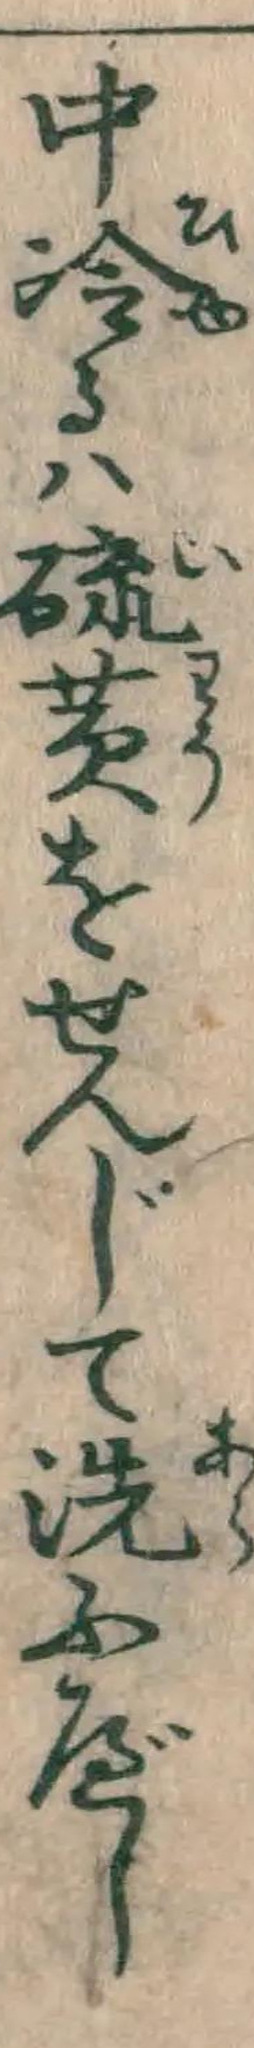中冷るは硫黄をせんじて洗ふべし

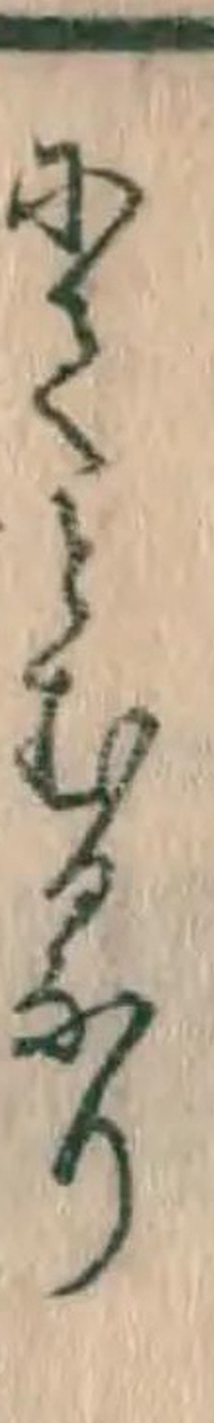にてとむるなり
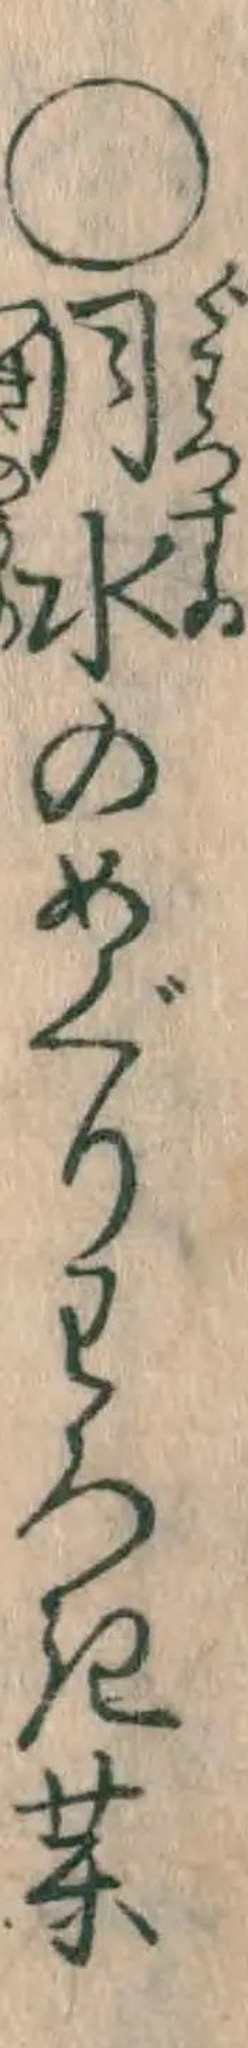○月水のめぐりわろき薬
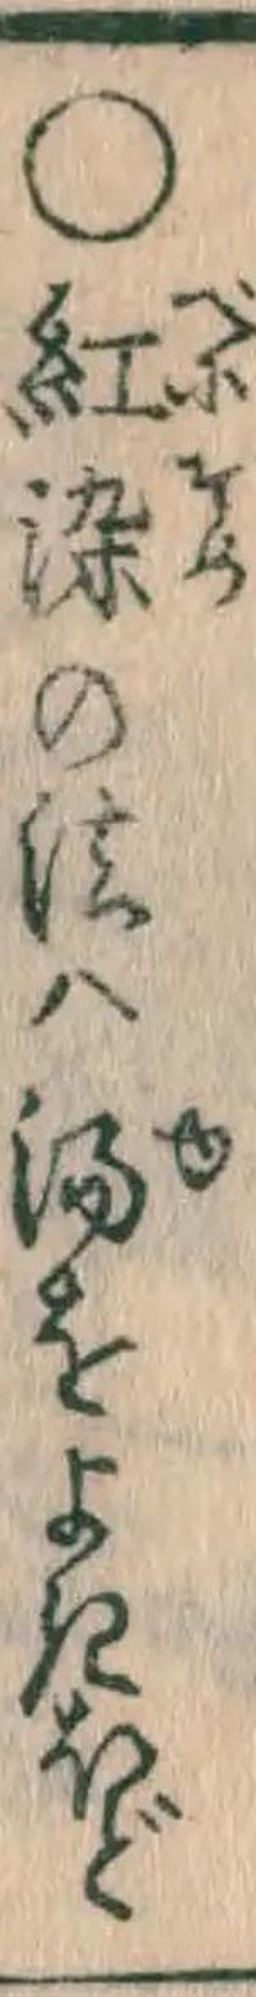○紅染の法は湯をよきほど
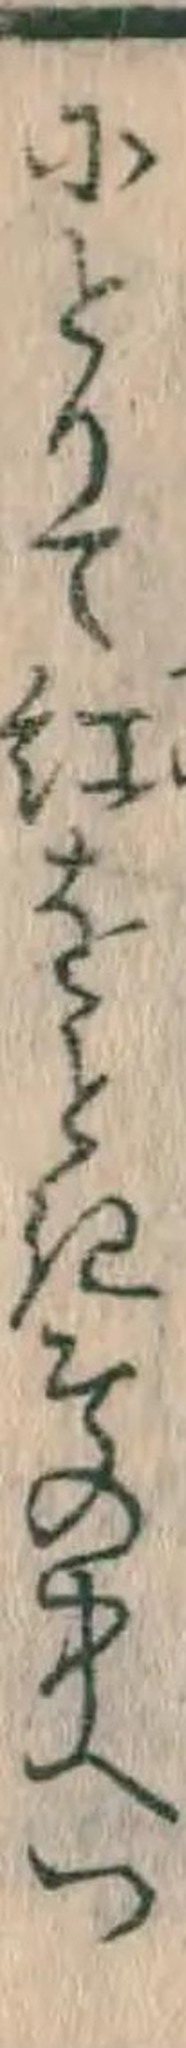にとりて紅をときその中へつ
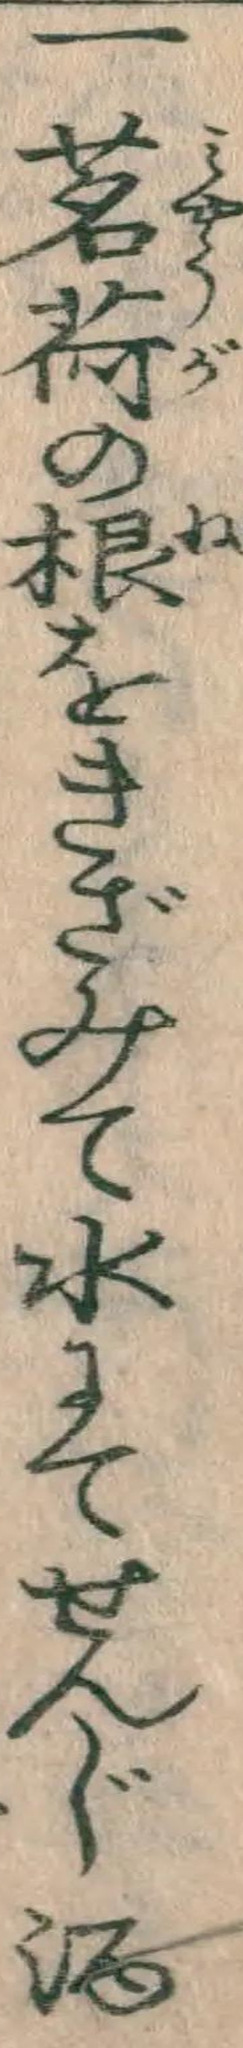一茗荷の根をきざみて水にてせんじ酒
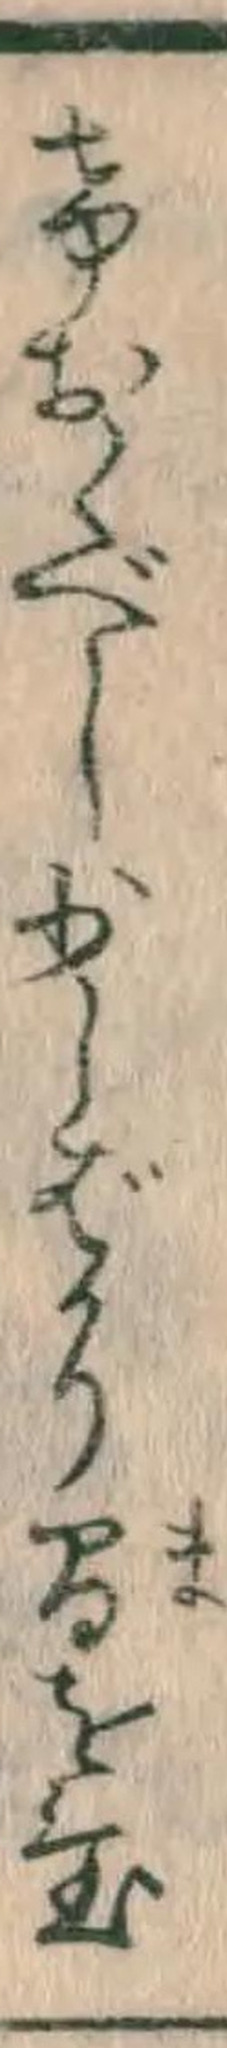けおくべし少しばかり間を置
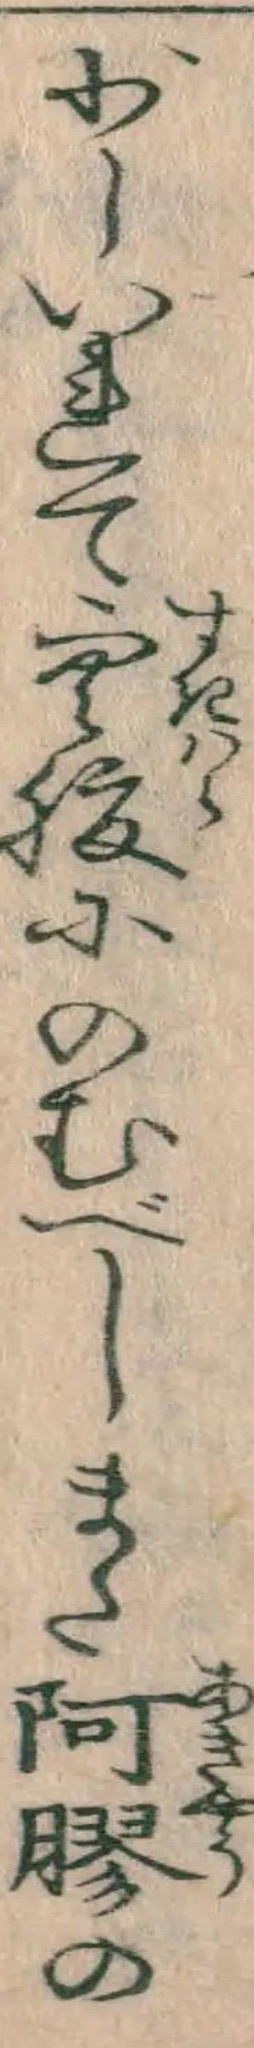少しいれて空腹にのむべしまた阿膠の
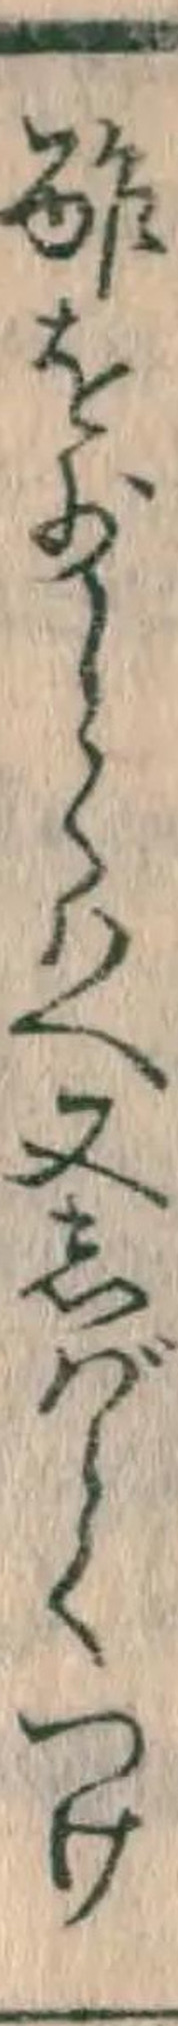酢を少しくはへ又しばらくつけ
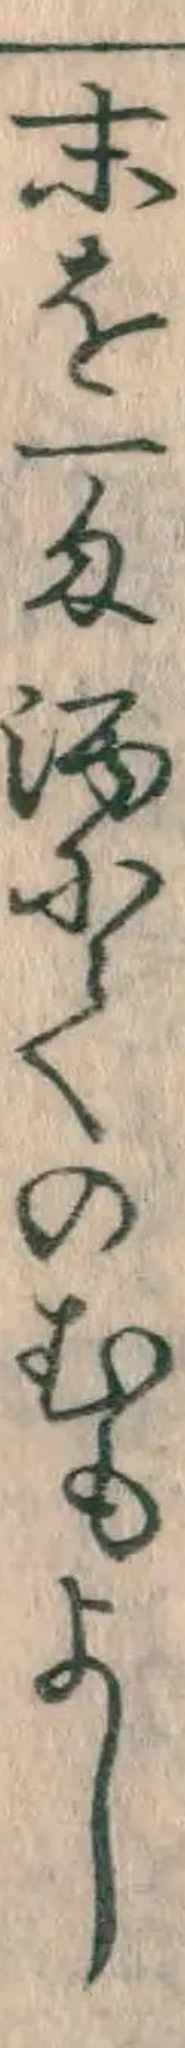末を一匁酒にてのむもよし
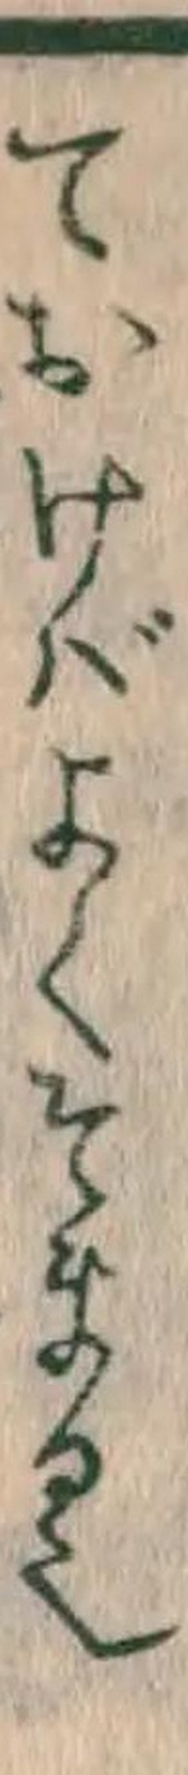ておけばよくそまる也
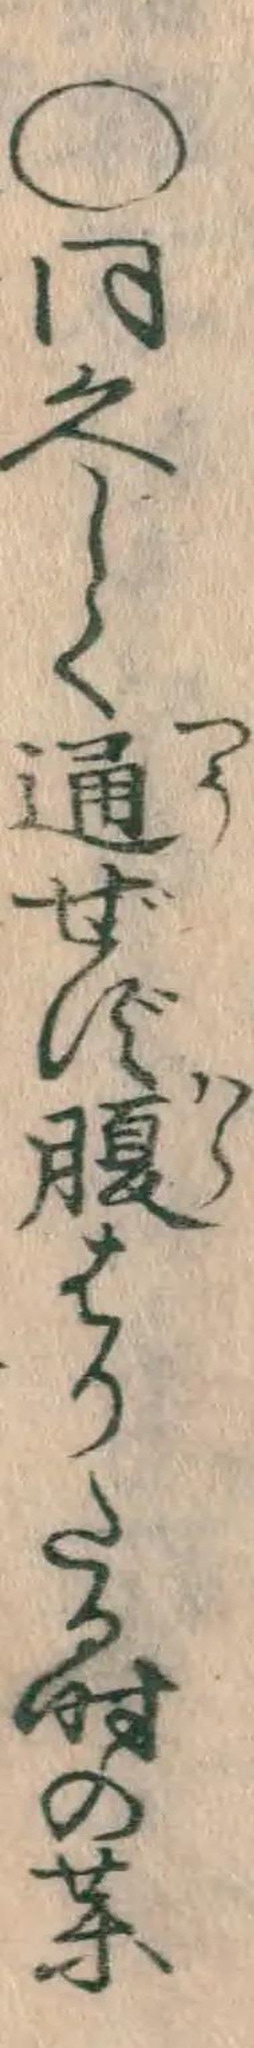○同久しく通ぜず腹はりたる時の薬
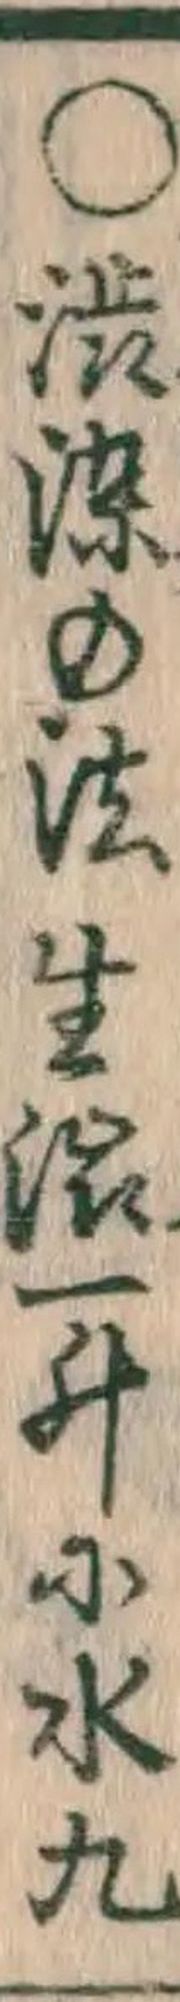○渋染の法生渋一升に水九
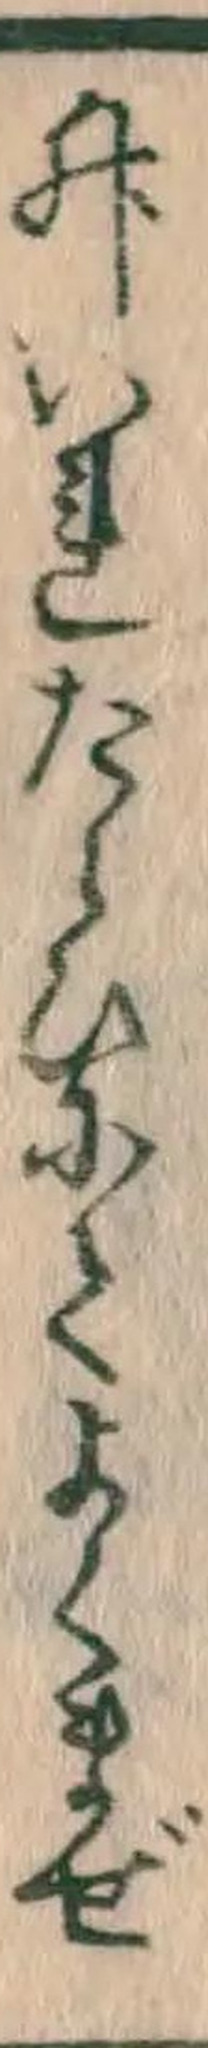升いれたらひにてよくまぜ
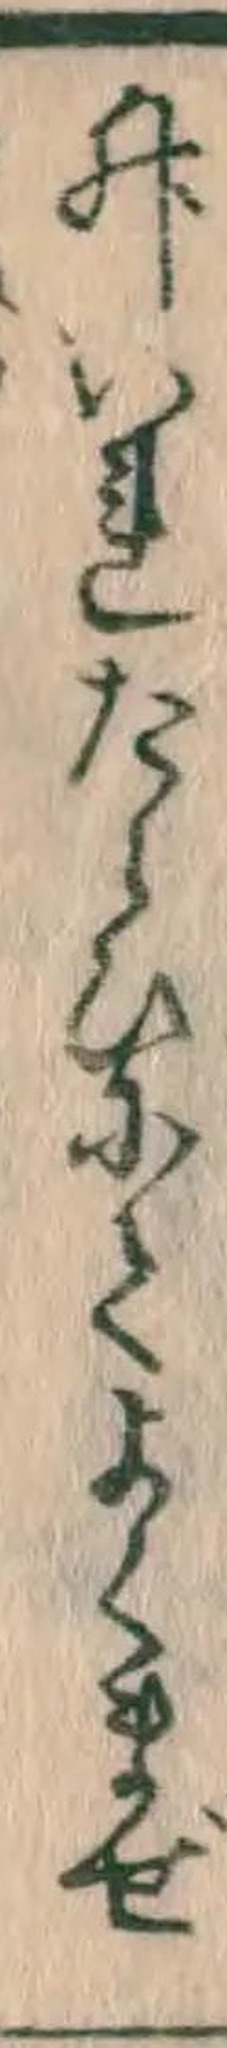升いれたらひにてよくまぜ
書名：広益秘事大全 3巻. [3]
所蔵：国立国会図書館 National Diet Library, JAPAN
